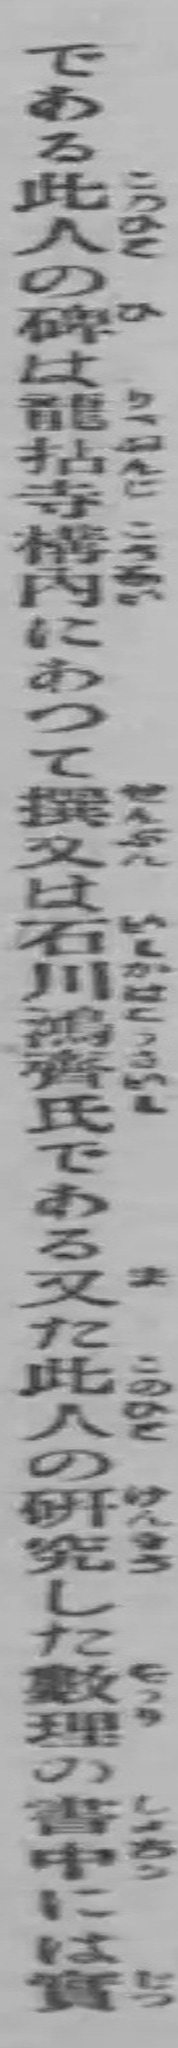である此人の碑は龍拈寺構内にあつて撰文は石川鴻斉氏である又た此人の研究した数理の書中には実
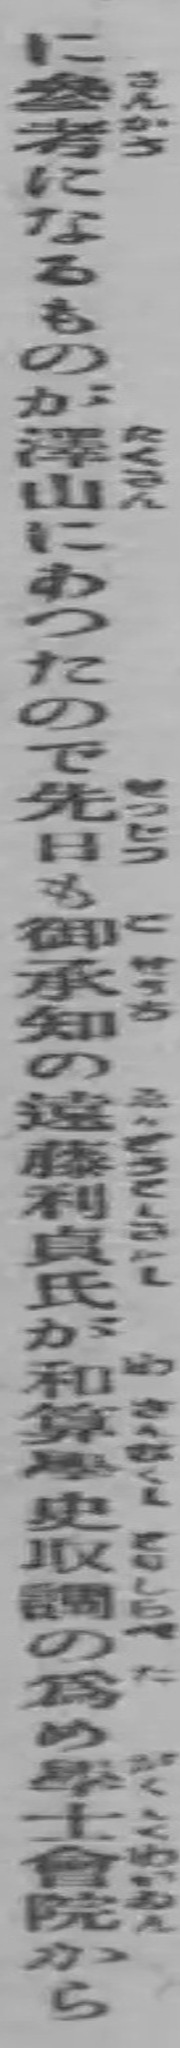に参考になるものが沢山にあつたので先日も御承知の遠藤利貞氏が和算学史取調の為め学士会院から

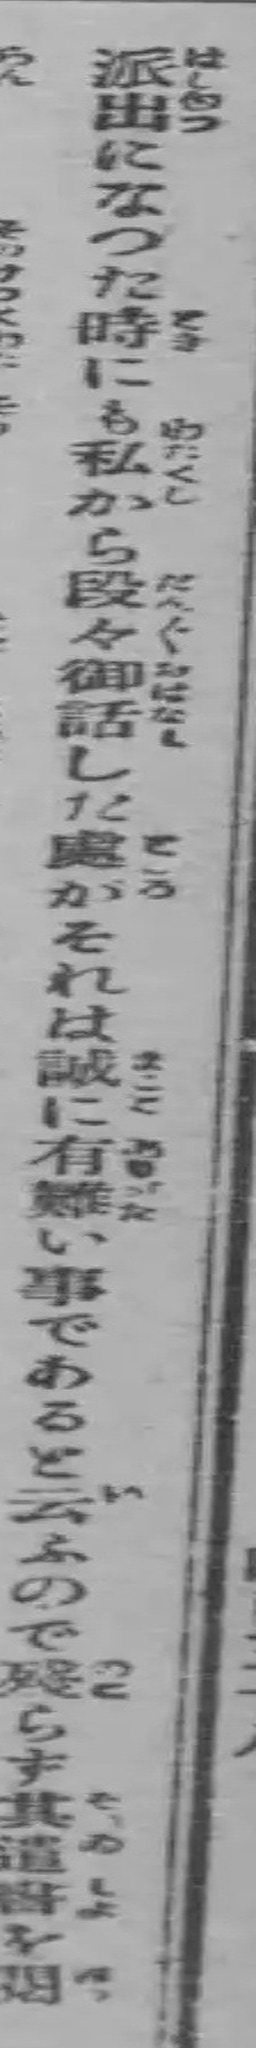派出になつた時にも私から段々御話した処がそれは誠に有難い事であると云ふので残らず其遺書を閲
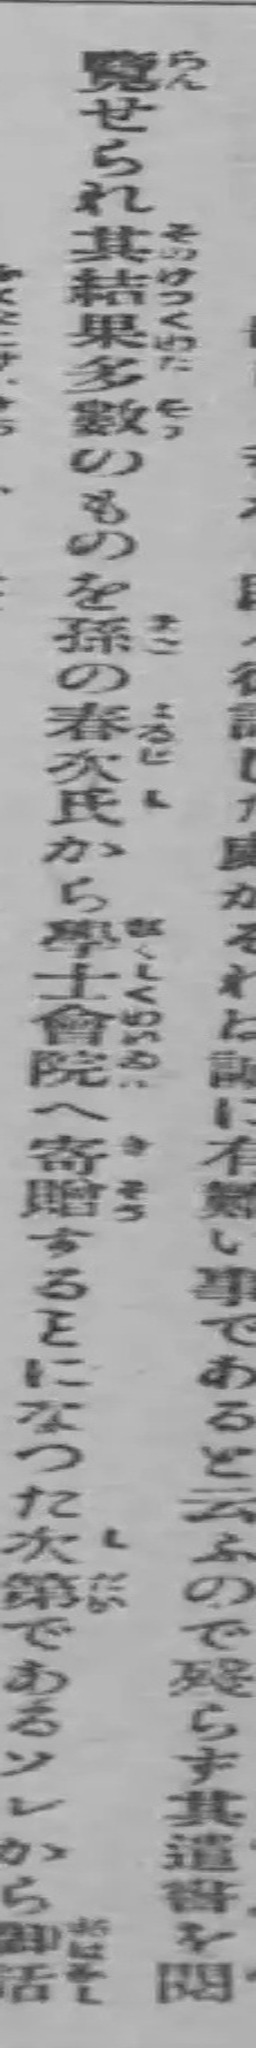覧せられ其結果多数のものを孫の春次氏から学士会院へ寄贈すっることになつた次第であるソレから御話
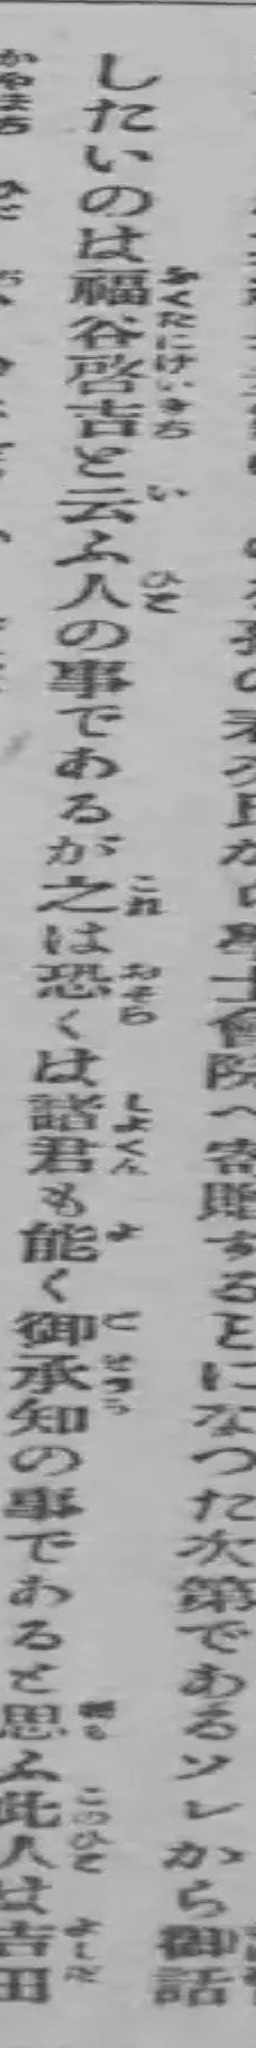福谷啓吉したいのは福谷啓吉と云ふ人の事であるが之は恐くは諸君も能く御承知の事であると思ふ此人は吉田
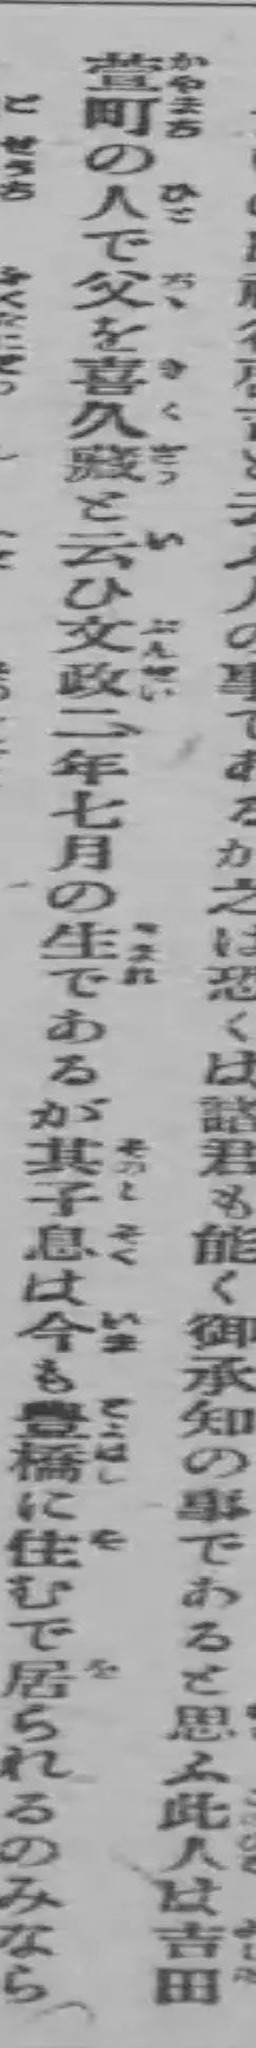萱町の人で父を喜久蔵と云ひ文政二年七月の生であるが其子息は今も豊橋に住むで居られるのみなら
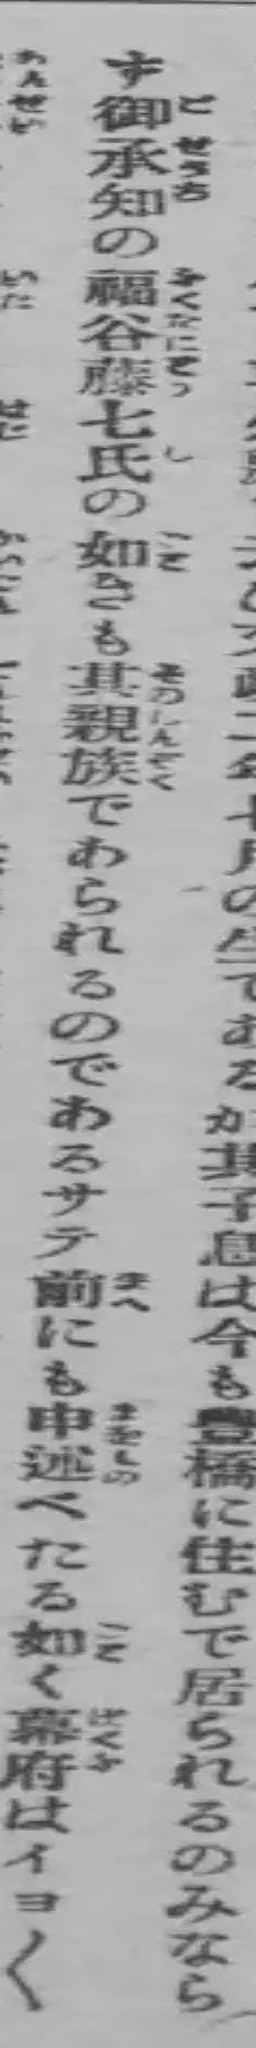ず御承知の福谷藤七氏の如きも其親族であられるのであるサテ前にも申述べたる如く幕府はイヨ〳〵
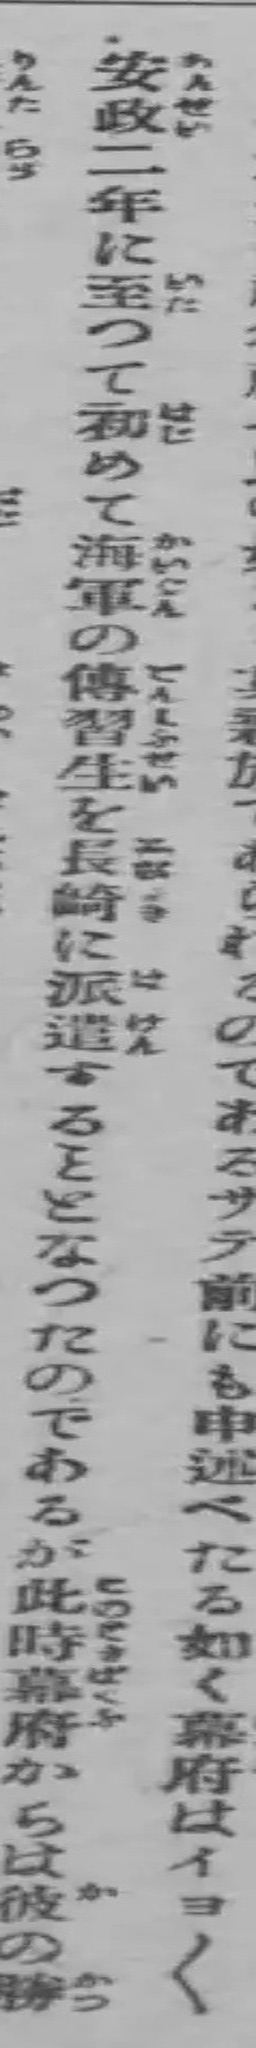安政二年に至つて初めて海軍の伝習生を長崎に派遣することとなつたのであるが此時幕府からは彼の勝
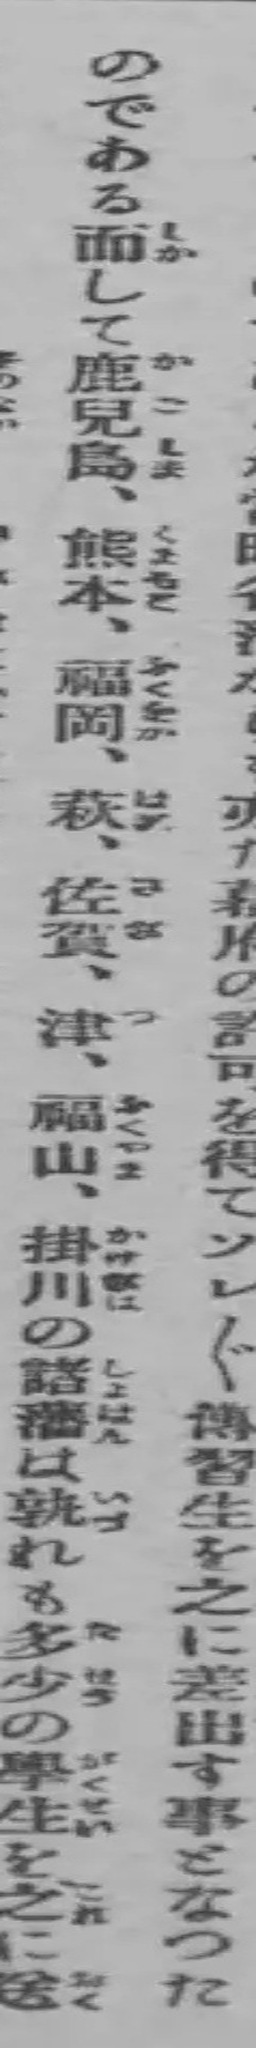のである而して鹿児島、熊本、福岡、萩、佐賀、津、福山、掛川の諸藩は孰れも多少の学生を之に送
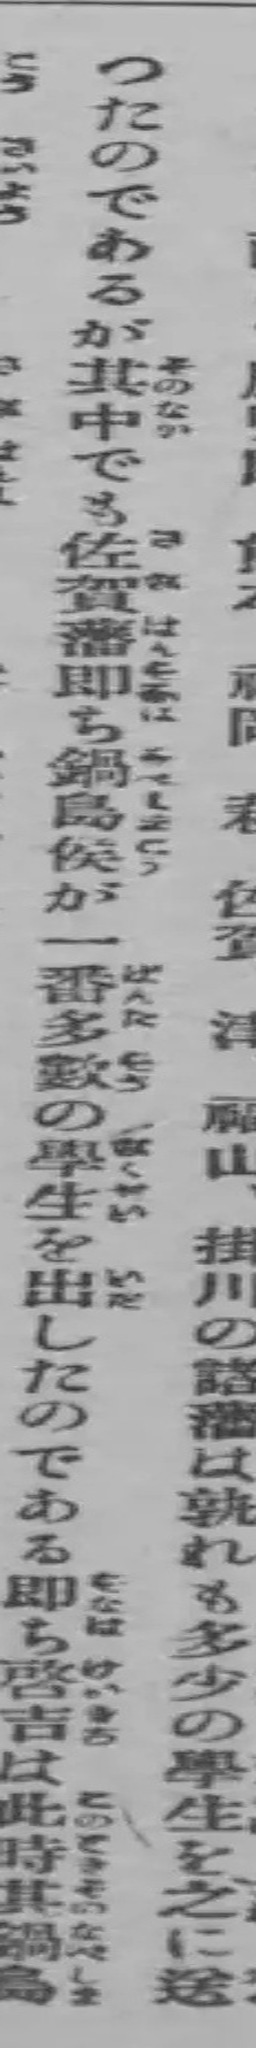つたのであるが其中でも佐賀藩即ち鍋島侯が一番多数の学生を出したのである即ち啓吉は此時其鍋島
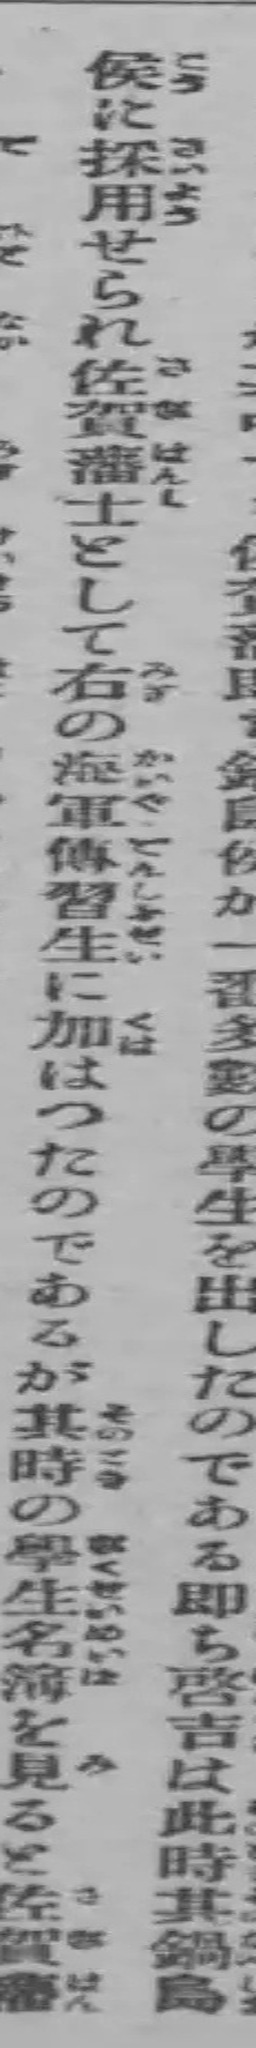侯に採用せられ佐賀藩士として右の海軍伝習生に加はつたのであるが其時の学生名簿を見ると佐賀藩
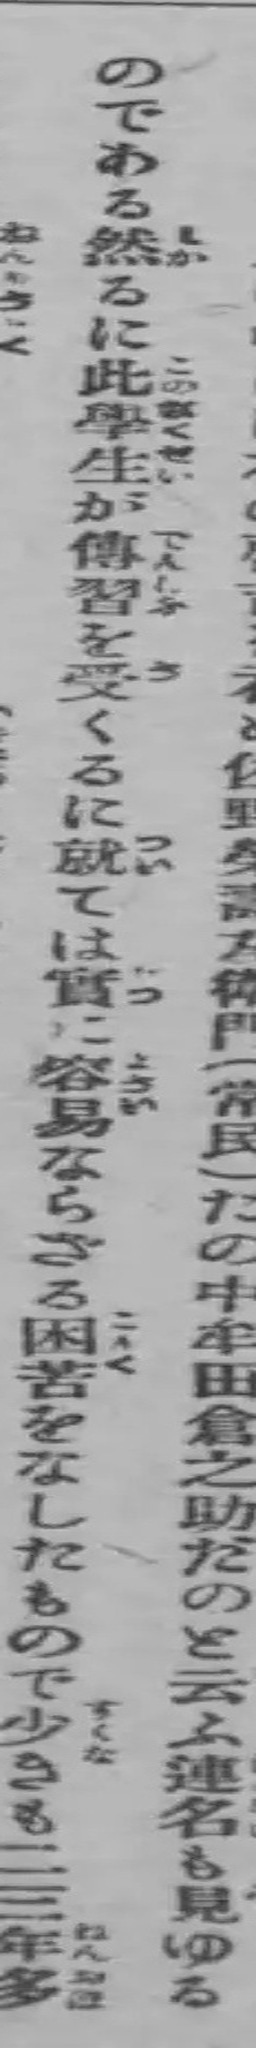のである然るに此学生が伝習を受くるに就ては実に容易ならざる困苦をなしたもので少きも二三年多
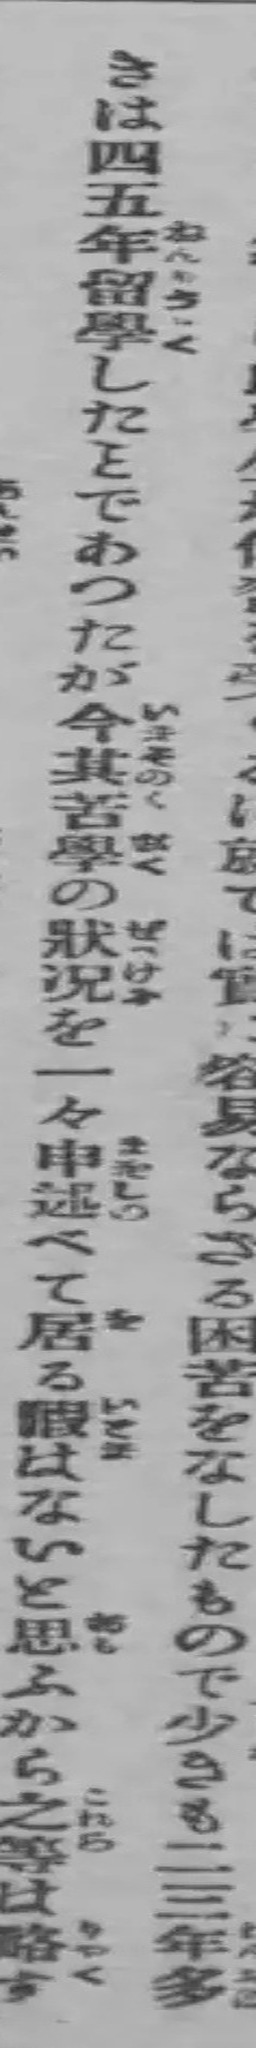きは四五年留学したことであつたが今其苦学の状況を一々申述べて居る暇はないと思ふから之等は略す
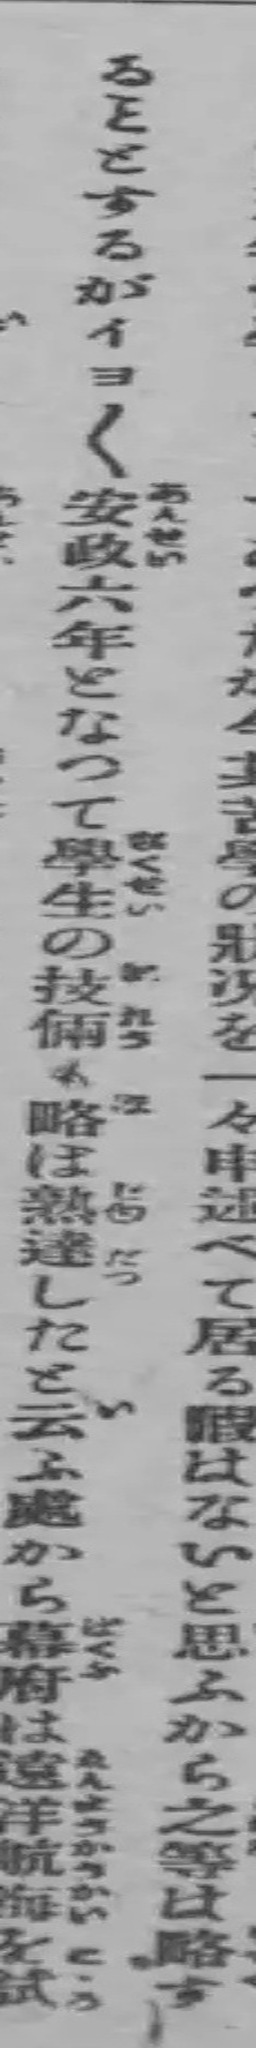ることとするがイヨ〳〵安政六年となつて学生の技倆も略ぼ熟達したと云ふ処から幕府は遠洋航海を試
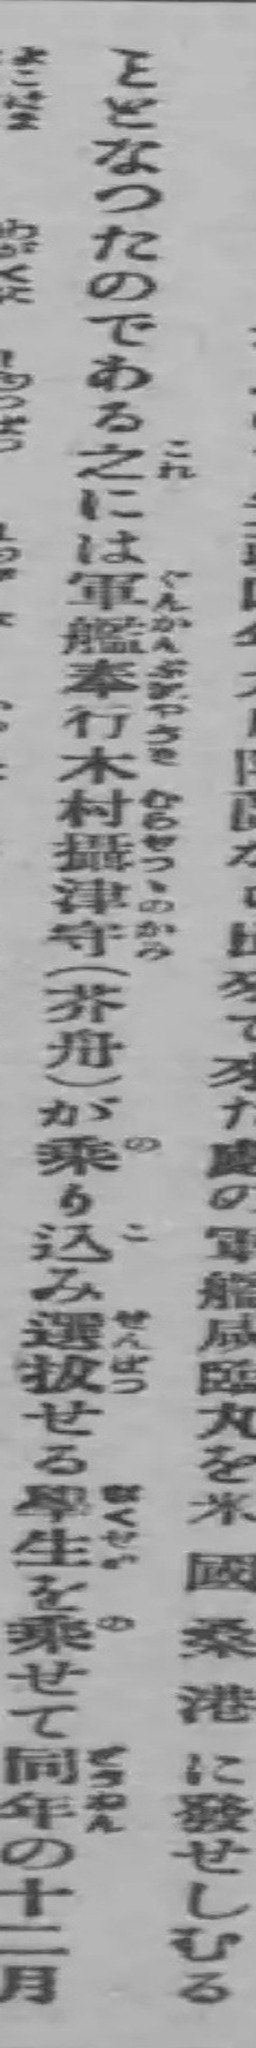こととなつたのである之には軍艦奉行木村摂津守(芥舟)が乗り込み選抜せる学生を乗せて同年の十二月
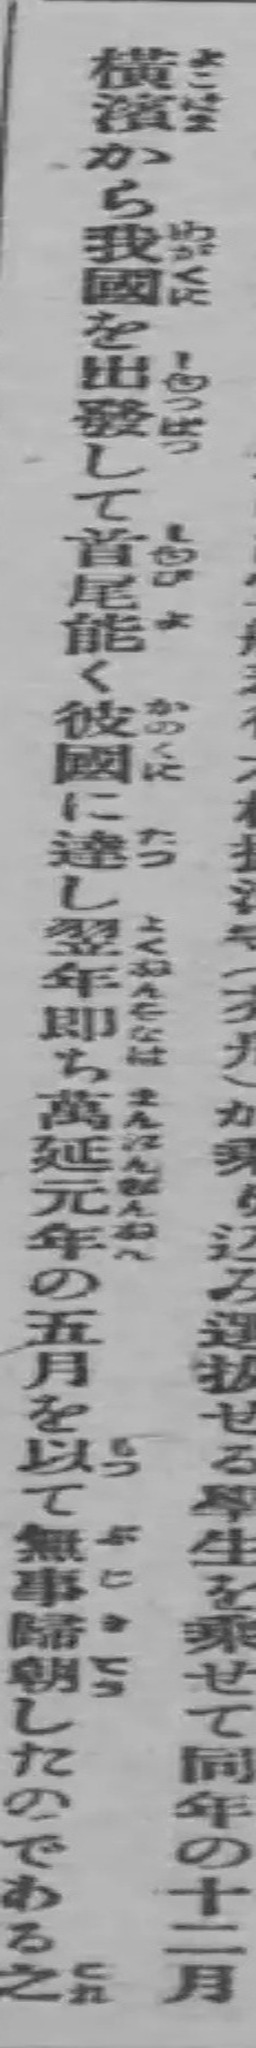横浜から我国を出発して首尾能く彼国に達し翌年即ち万延元年の五月を以て無事帰朝したのである之
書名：豊橋市史談
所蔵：国立国会図書館 National Diet Library, JAPAN
